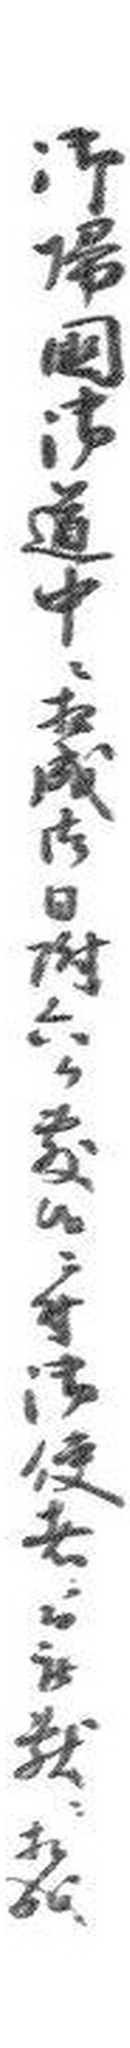御帰国御道中ニ相成御日附六ケ敷候ニ付御使者ニ而被献ニ相成
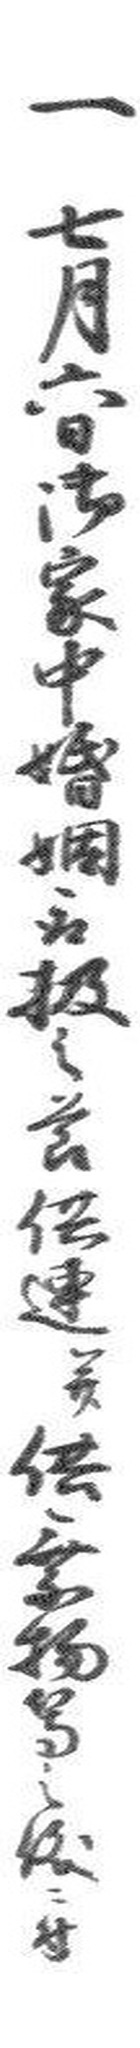一七月六日御家中婚姻取扱之節供連并供乗物等之儀ニ付
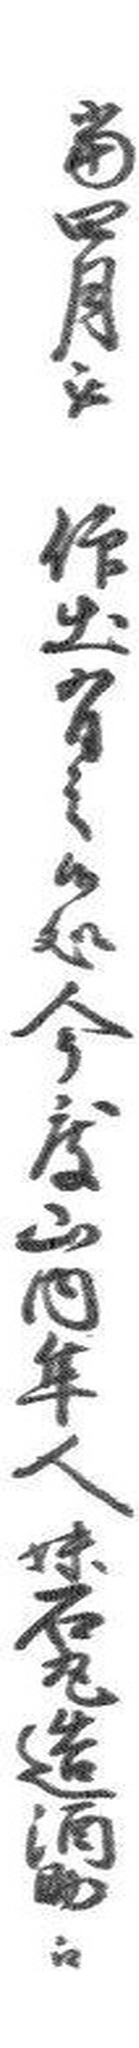当四月被仰出有之候処今度山内隼人妹石丸造酒助江
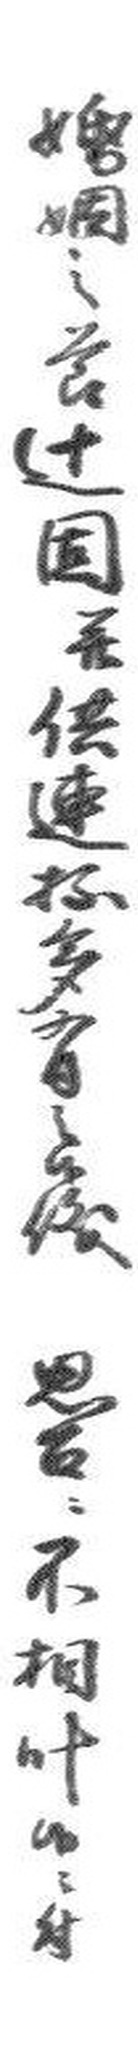婚姻之節辻固并供連抔多有之候儀思召ニ不相叶候ニ付
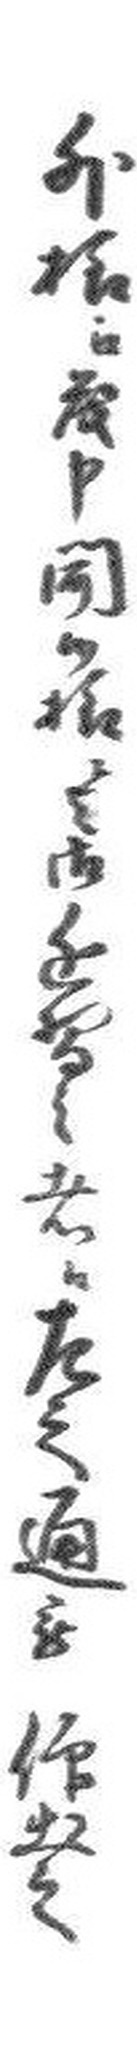外様江も申聞候様ニと御近習之者江左之通被仰出之
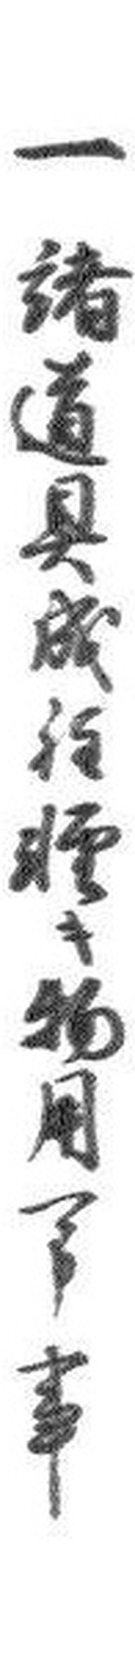一諸道具成程軽キ物用可申事
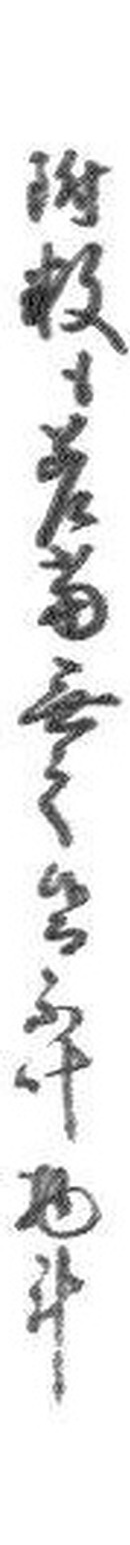附数も差当無之候而不叶物斗

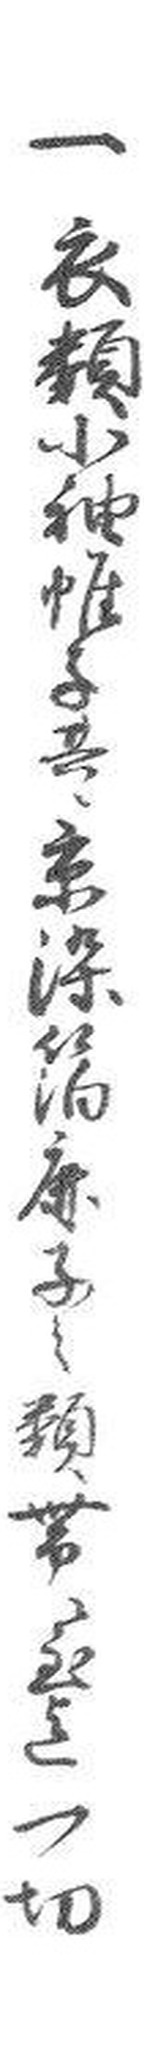一衣類小袖帷子共々京染箔鹿子之類帯ニ至迄一切
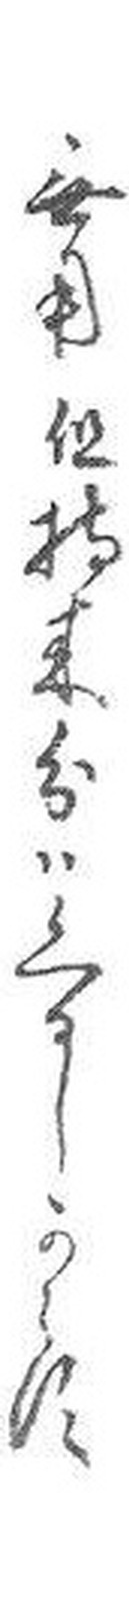無用但持来分はくるしからす
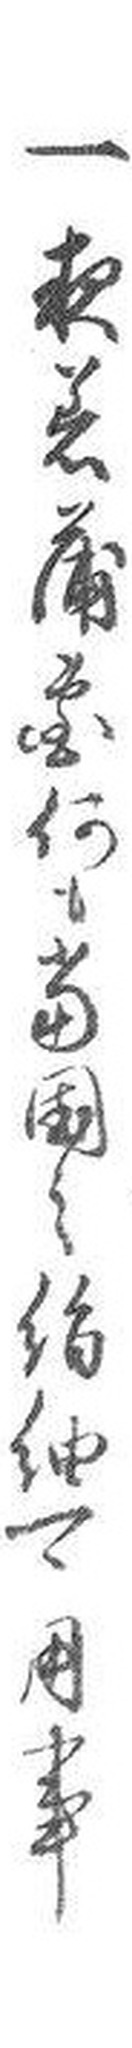一夜着蒲団何も当国之絹紬可用事
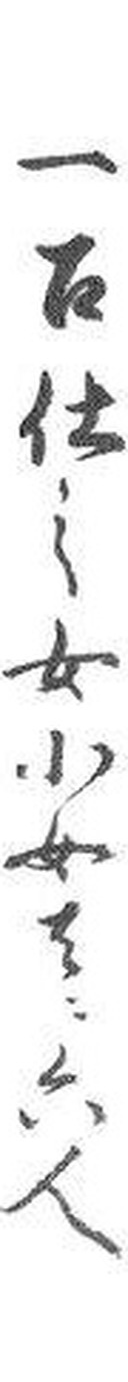一召仕之女小女共ニ六人
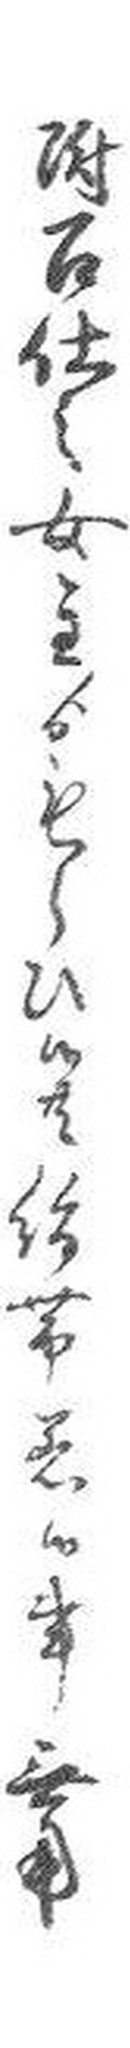附召仕之女主ゟもらひ候共絹帯着候事無用
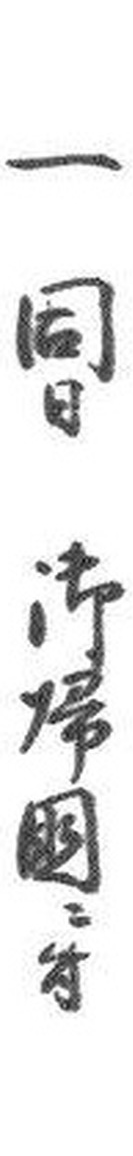一同日御帰国ニ付
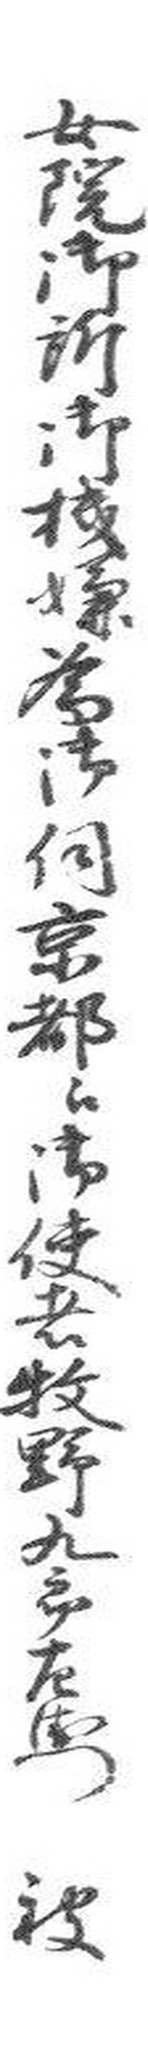女院御所御機嫌為御伺京都江御使者牧野九郎左衛門被
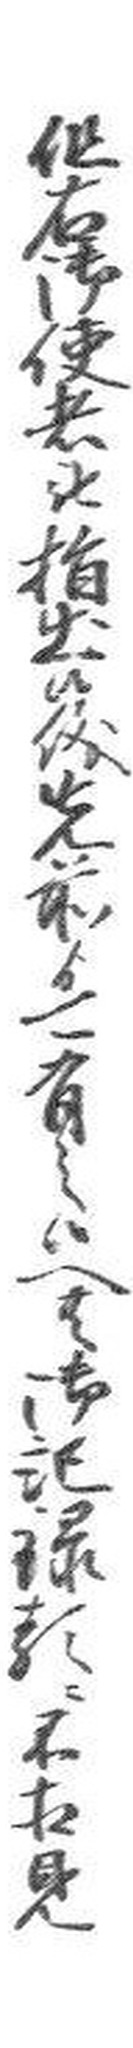但右御使者被指出候儀先前ゟ可有之候へ共御記録類ニ不相見
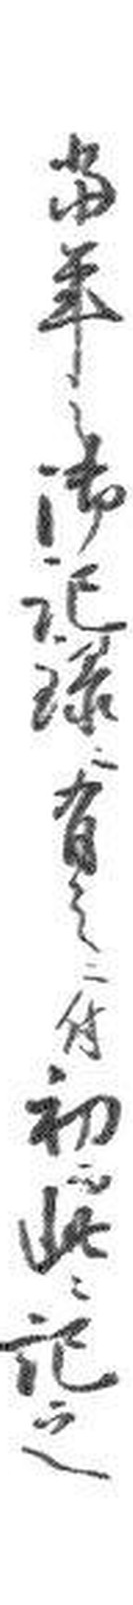当年之御記録ニ有之ニ付初而此ニ記之
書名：家譜 六 光通公 従万治三年到寛文三年
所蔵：福井県文書館 Fukui Prefectural Archives
